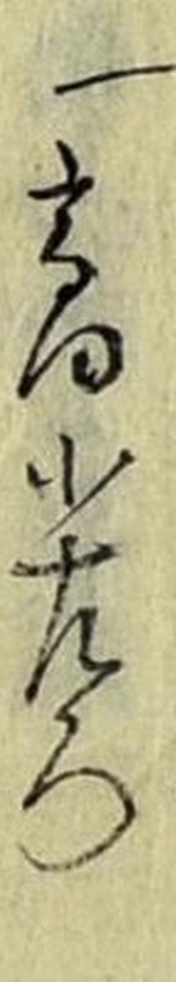高田小左衛門
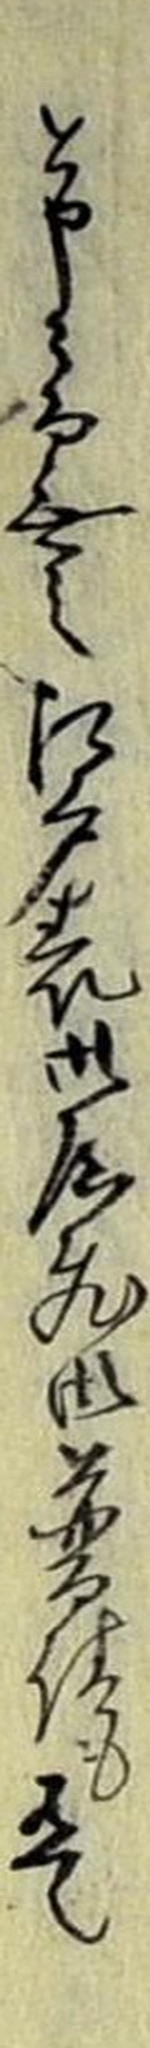と申ニ而無之江戸表御屋敷御普請も有之
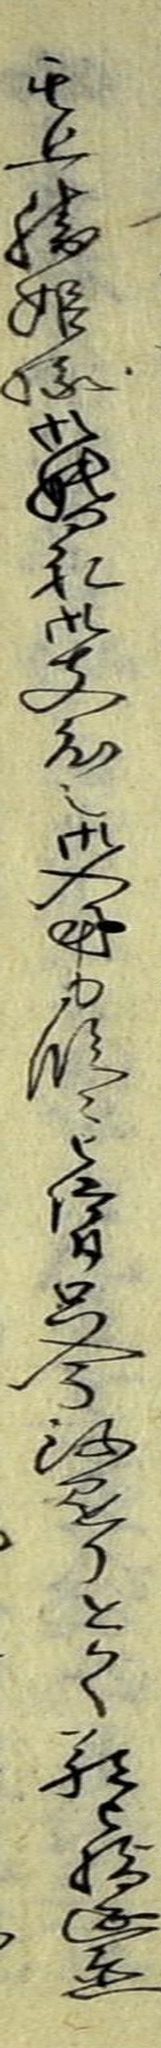其上勝姫様御婚礼御支度之御入用も段々被仰付只今致懸りとて難被指延置
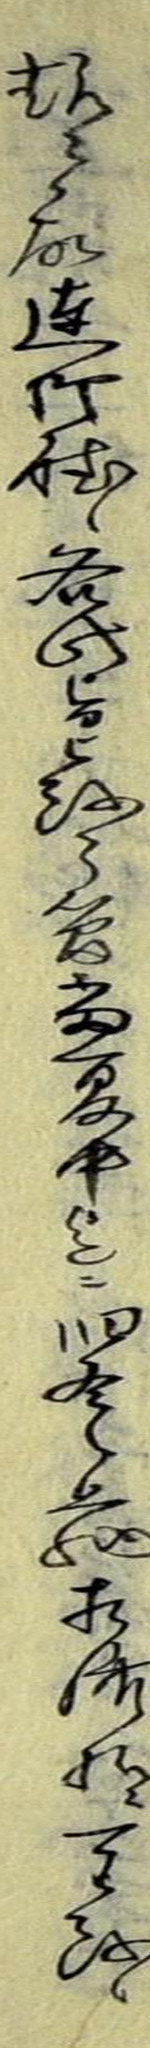趣ニ候故達御聴候各此旨被致了簡当夏中迄ニ旧冬之上納相済様ニ可被致候

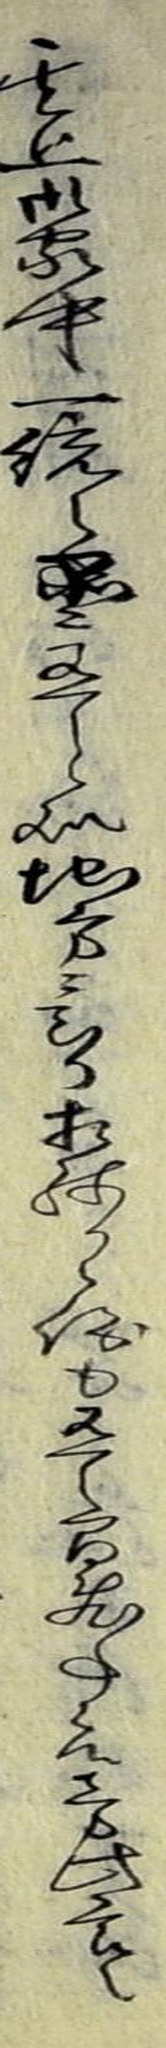其上御家中一統之ニ有之候処地方ニ至り相残り候儀も有之間敷事ニ候旁此節之
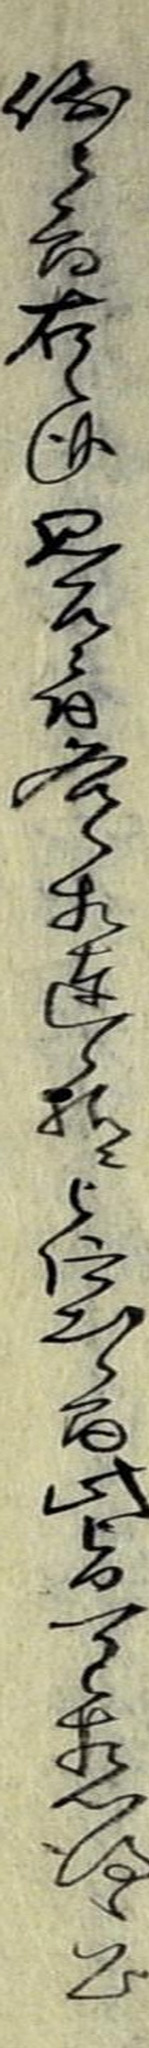儀ニ候間右之趣思召ニ付各へ相達候様ニ被仰出候間此旨可被相心得候以上
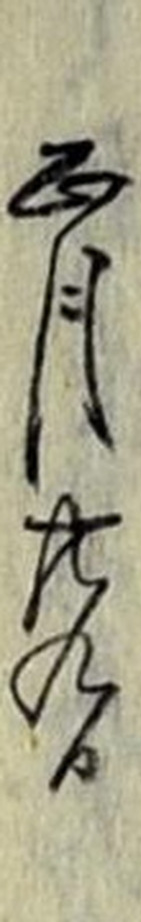正月廿九日
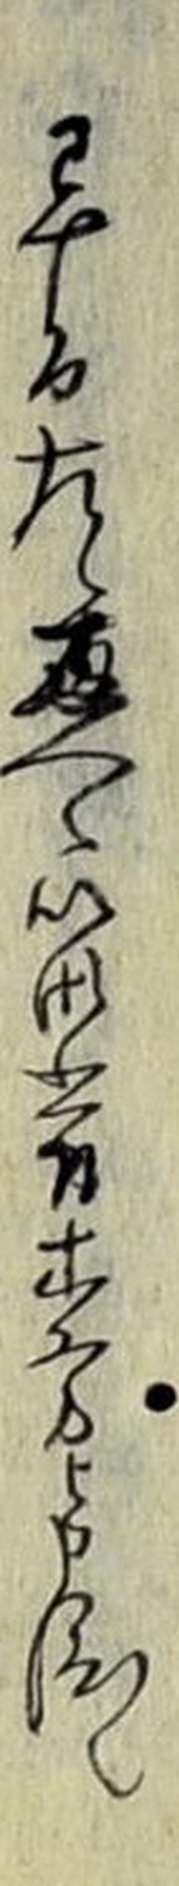畢而左之両人へ以御書付木工方被申渡之
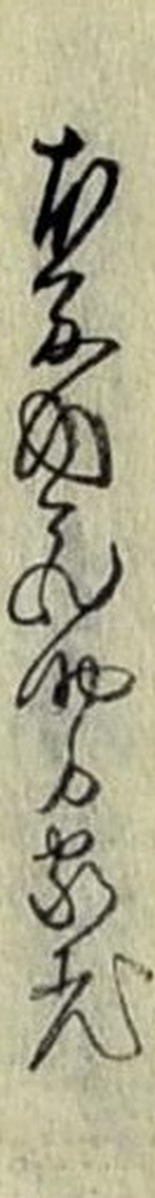本多内蔵助方家老
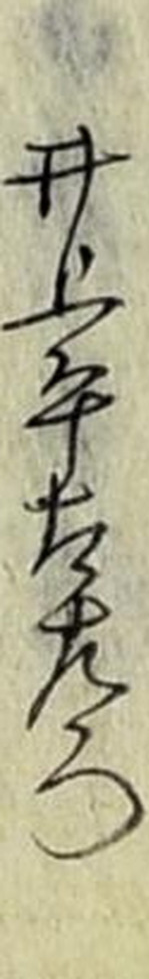井上平太左衛門
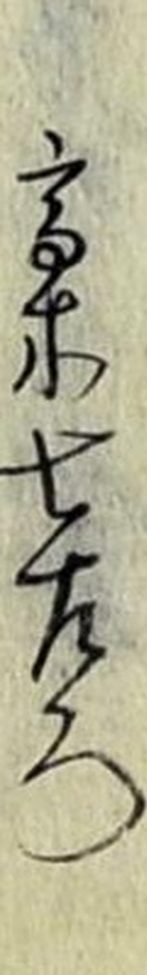高木七左衛門
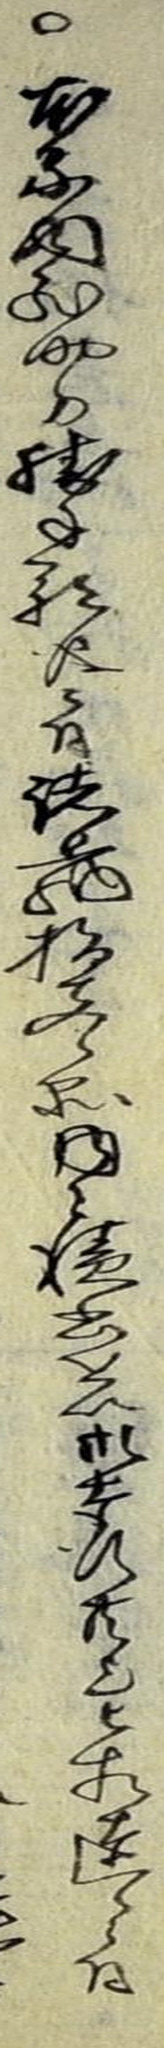〇本多内蔵助方勝手難儀ニ付諸上納指支候品内々積書を以御奉行共迄被相達候ニ付
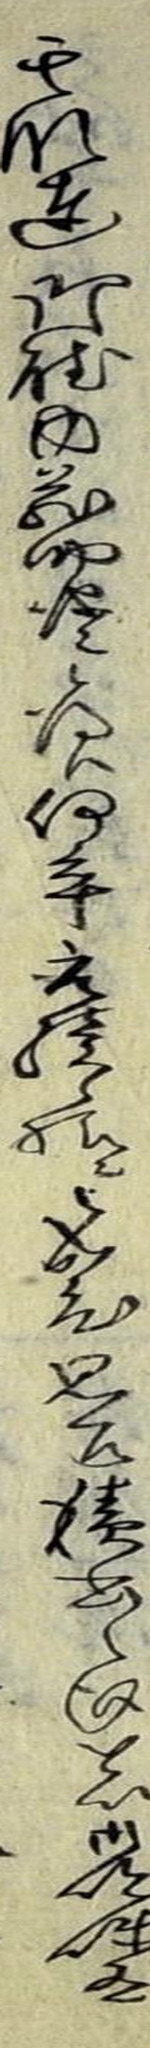其段達御聴内蔵助儀ニ候得ハ何卒取続候様ニ被成度思召積書之趣を以御吟味有
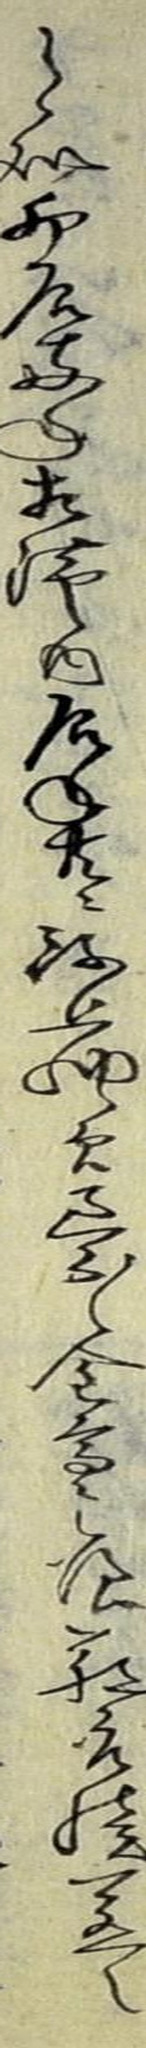之候処卯辰両年相滞内辰年共ニ致上納候而ハ過分之金高ニ候得ハ難取続可有之
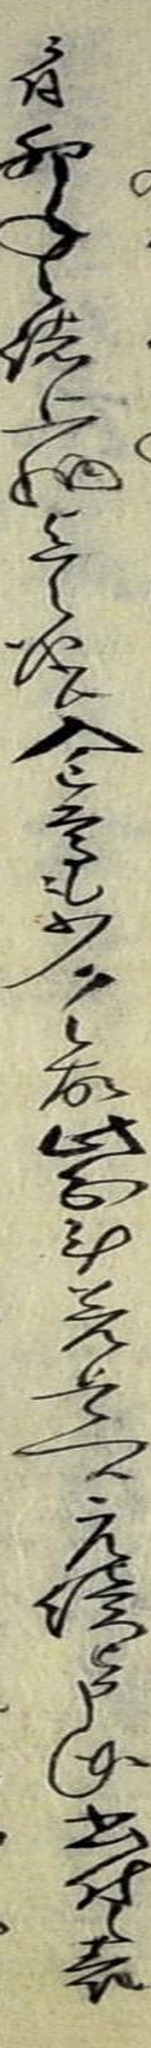ニ付卯年之諸上納迄之儀ハ金高も少ク候故此分斗差上候ヘハ取続被申趣書付之表
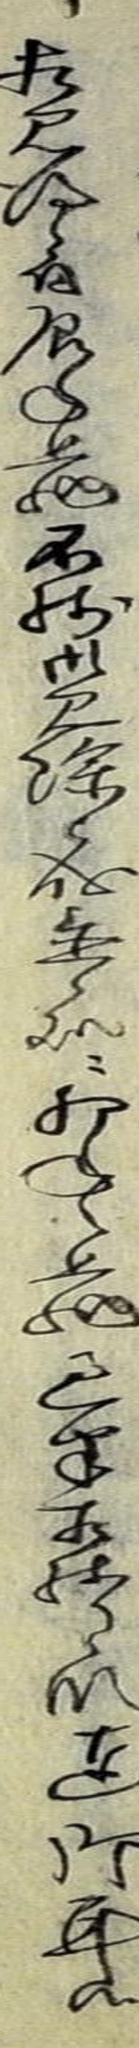相見得候ニ付辰年上納不残御見除被成置候処ニ卯年之上納過半相残り候段達御耳候
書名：命令之部 一
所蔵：福井県文書館 Fukui Prefectural Archives
